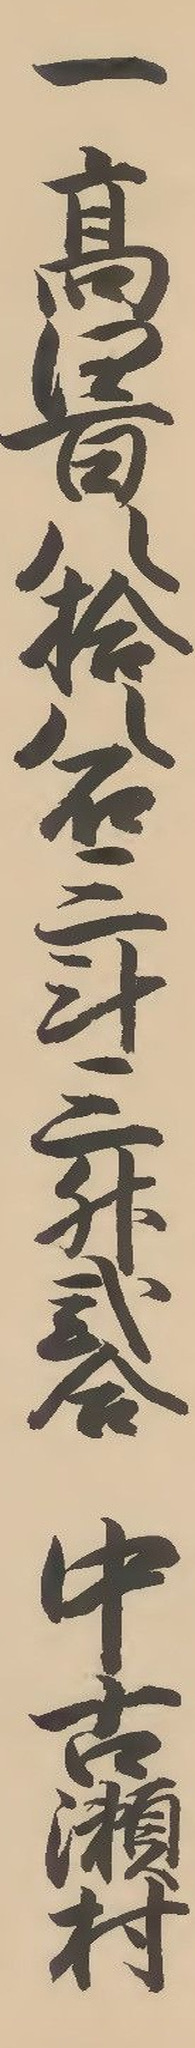一髙四百八拾八石三斗三升弐合中古瀬村
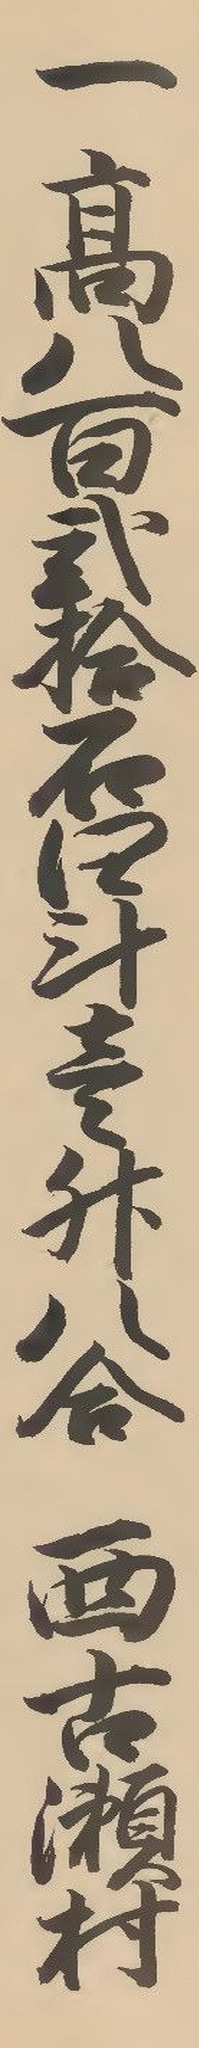一髙八百弐拾石四斗壱升八合西古瀬村
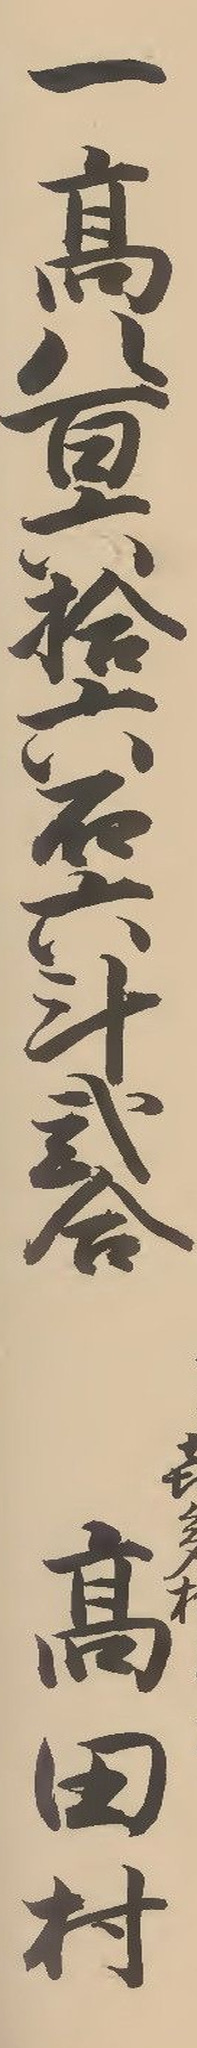一髙八百六拾六石六斗弐合髙田村
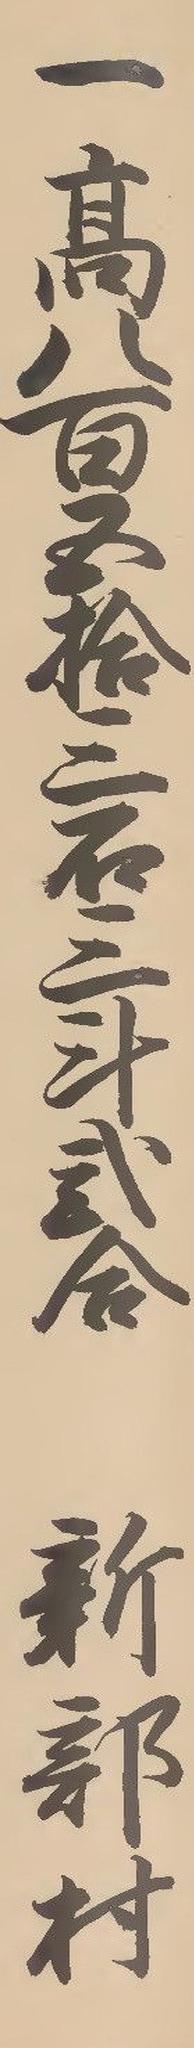一髙八百五拾三石三斗弐合新部村
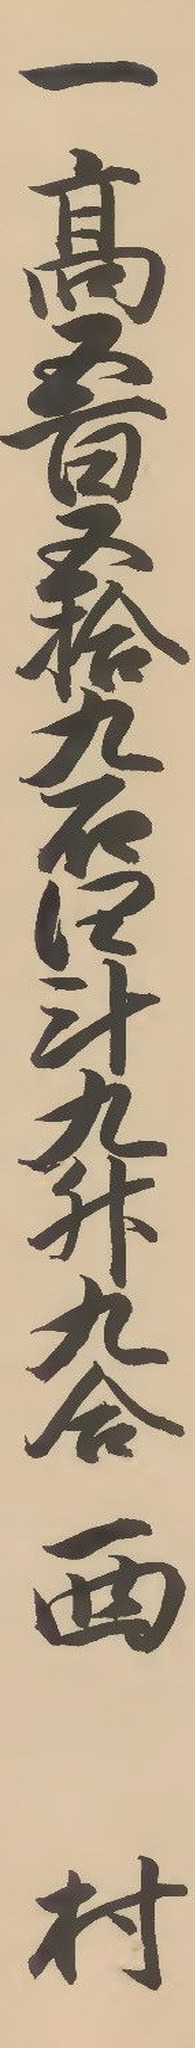一髙五百五拾九石四斗九升九合西村
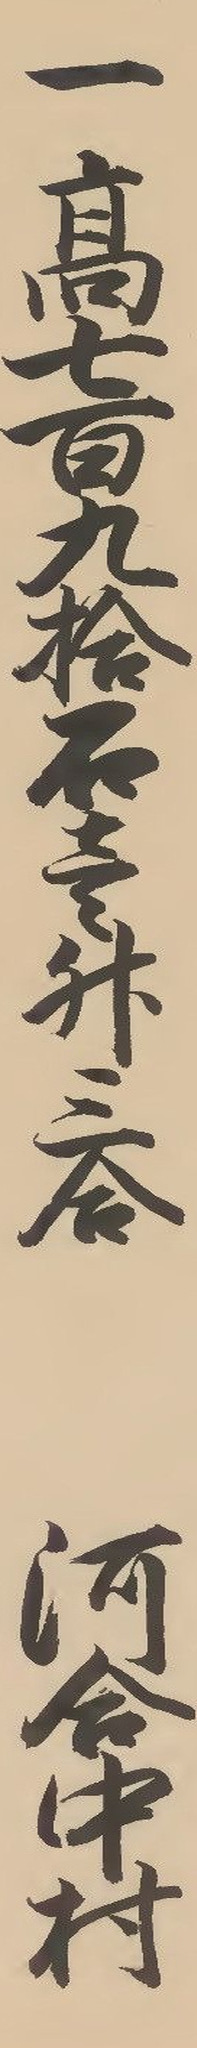一髙七百九拾石壱升三合河合中村
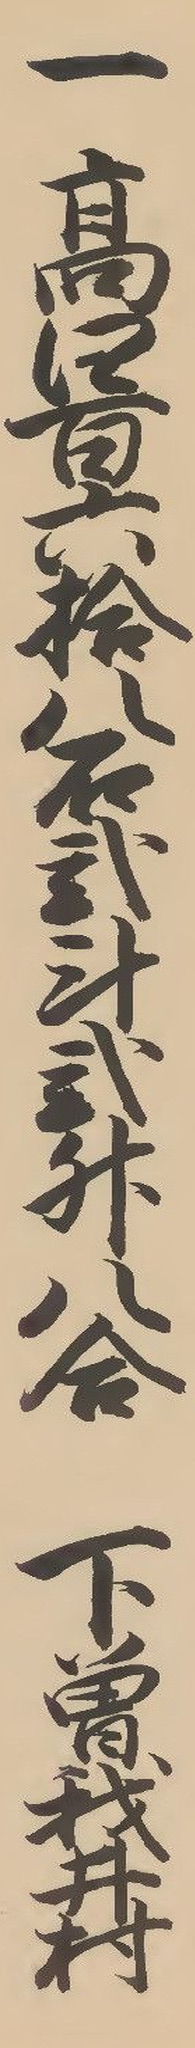一髙四百六拾八石弐斗弐升八合下曽我井村

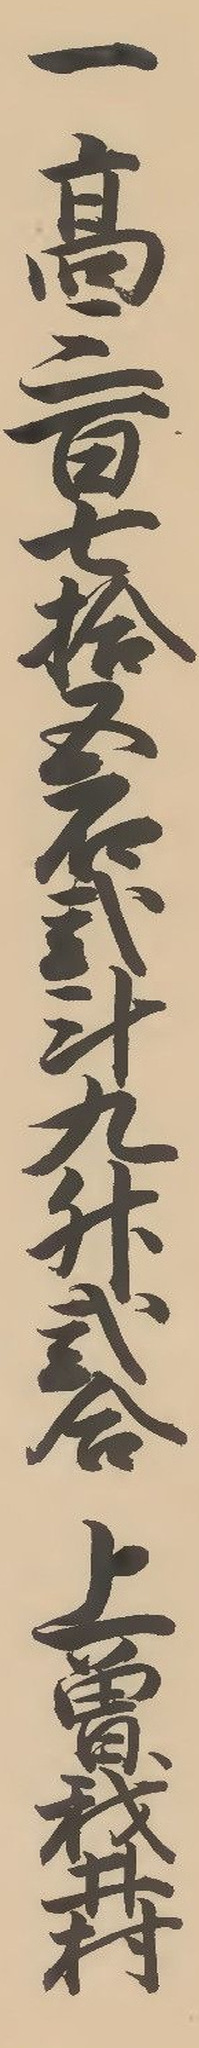一髙三百七拾五石弐斗九升弐合上曽我井村
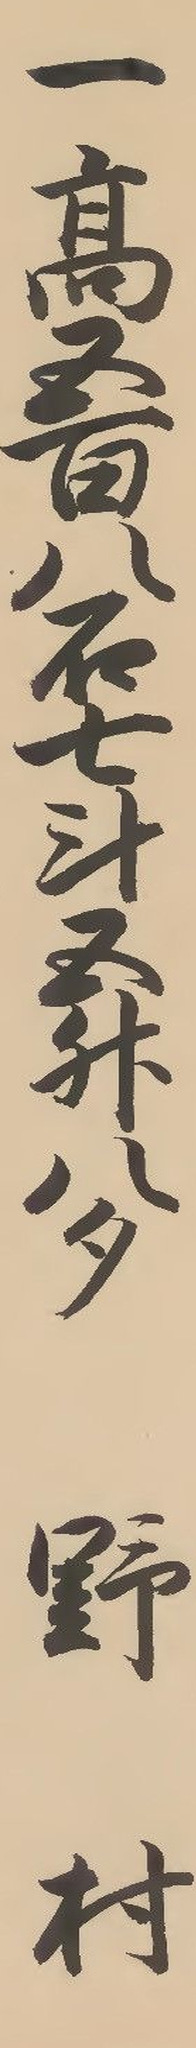一髙五百八石七斗五升八夕野村
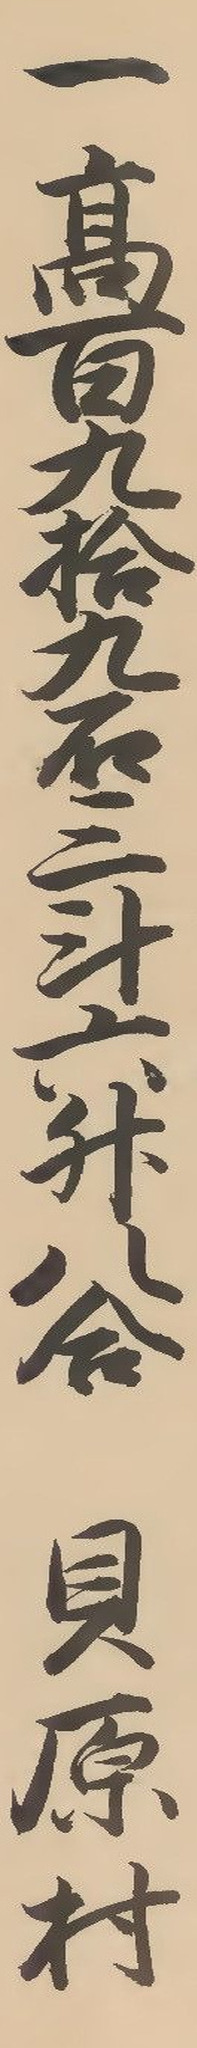一髙百九拾九石三斗六升八合貝原村
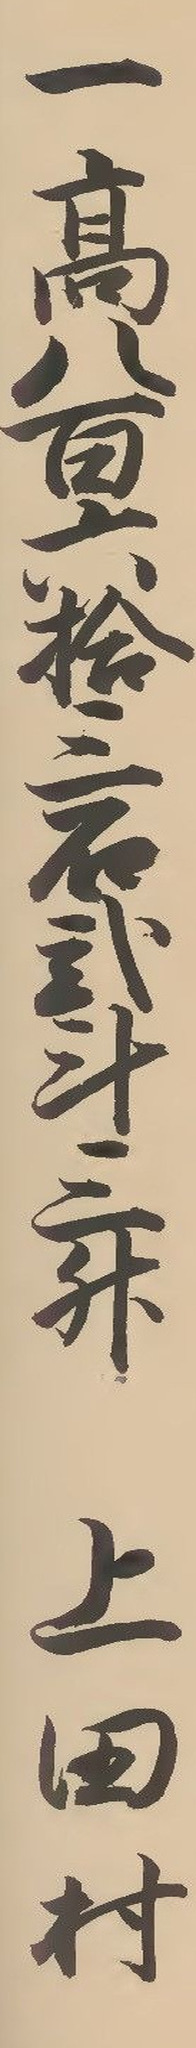一髙八百六拾三石弐斗三升上田村
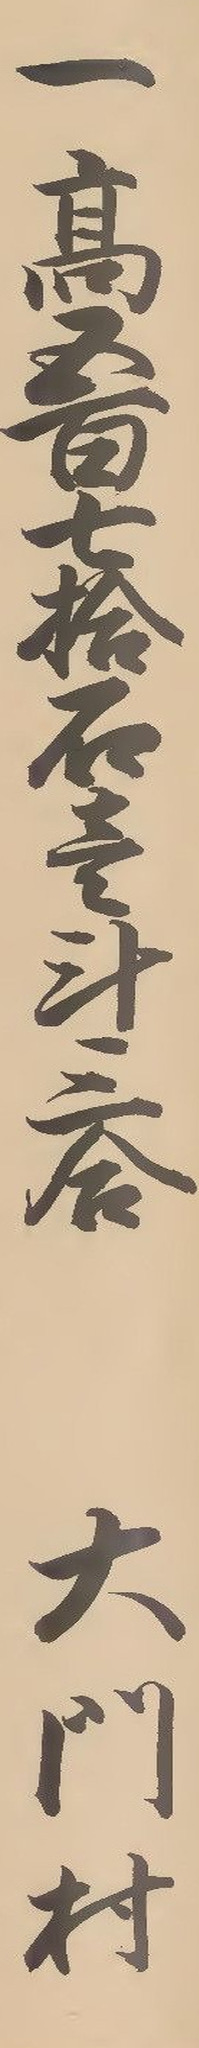一髙五百七拾石壱斗三合大門村
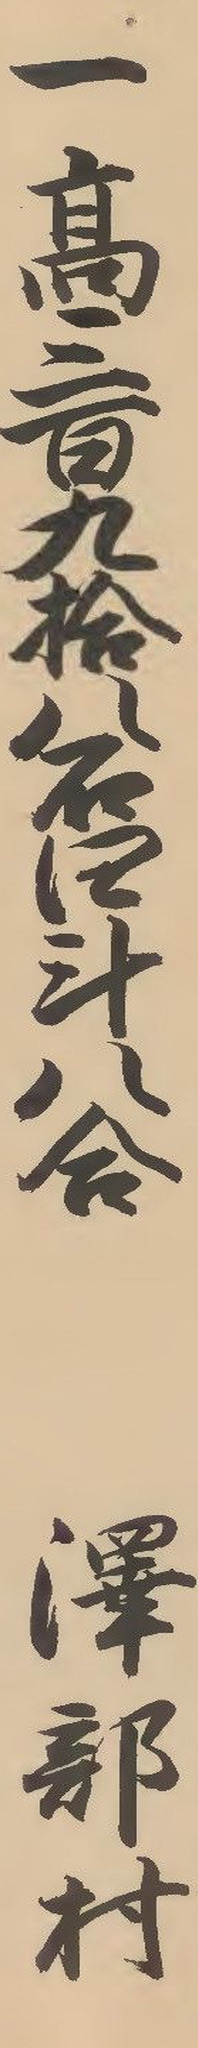一髙三百九拾八石四斗八合澤部村
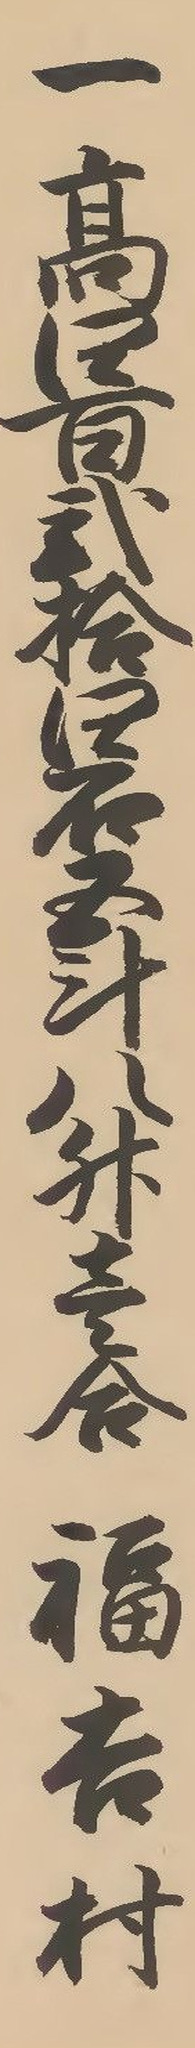一髙四百弐拾四石五斗八升壱合福吉村
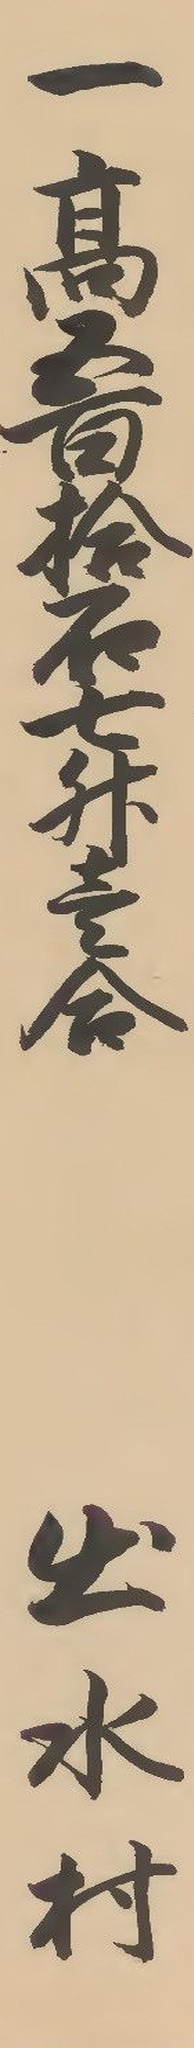一髙五百拾石七升壱合出水村

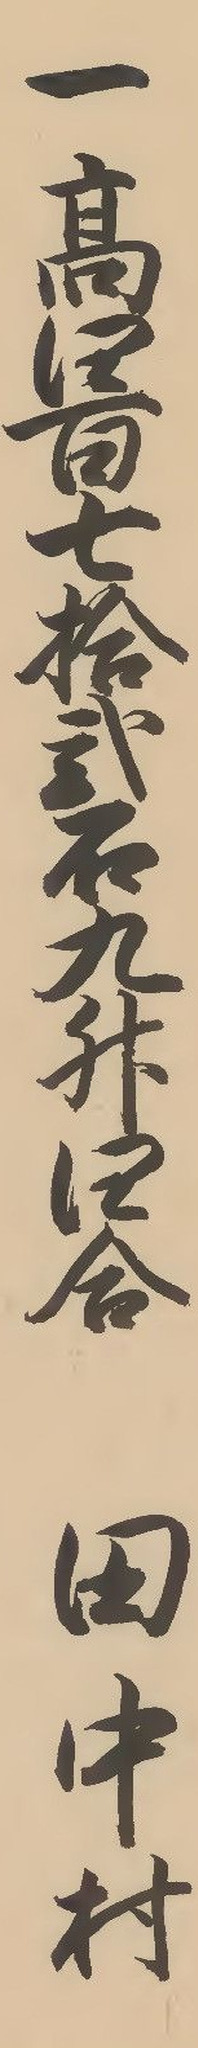一髙四百七拾弐石九升四合田中村
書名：播磨国郷帳
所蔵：国立公文書館 National Archives of Japan
